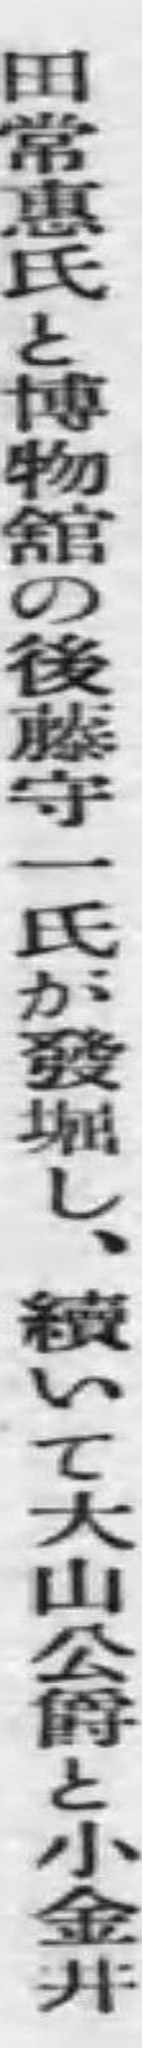田常恵氏と博物館の後藤守一氏が発堀し、続いて大山公爵と小金井
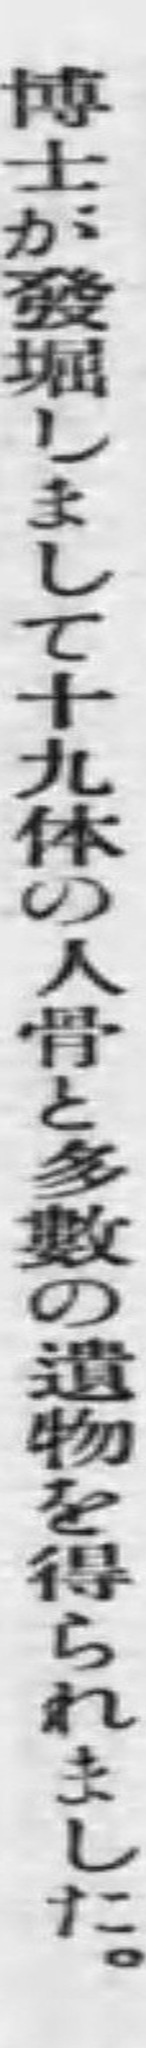博士が発堀しまして十九体の人骨と多数の遺物を得られました。
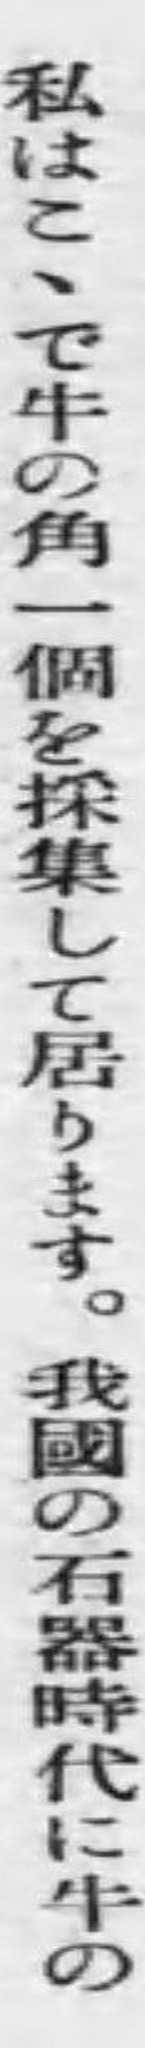私はこゝで牛の角一個を採集して居ります。我国の石器時代に牛の
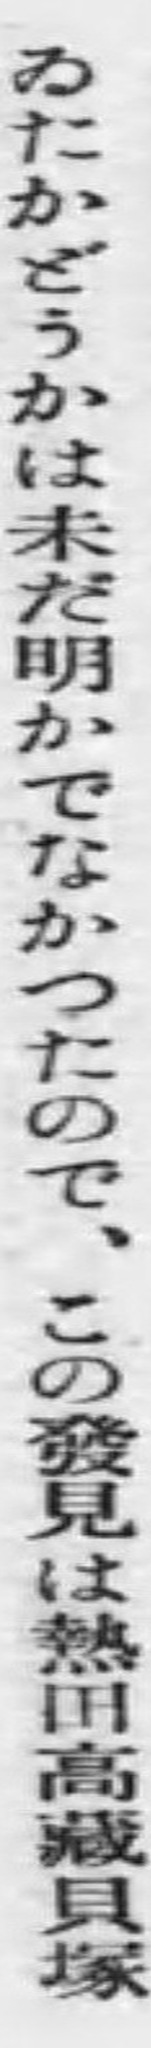ゐたかどうかは未だ明かでなかつたので、この発見は熱田高蔵貝塚
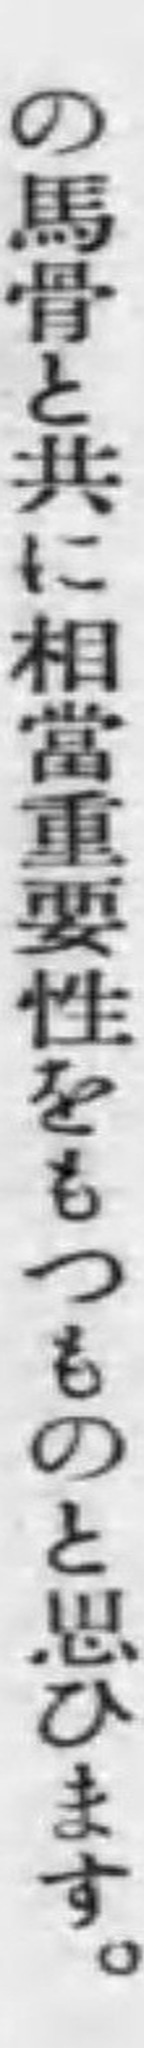の馬骨と共に相当重要性をもつものと思ひます。
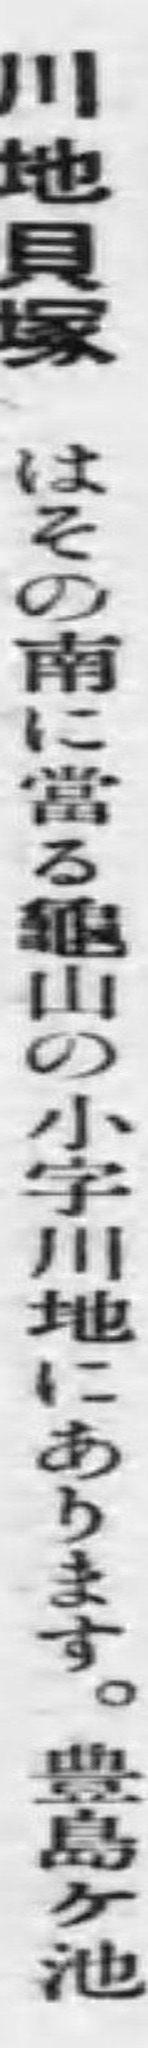川地貝塚はその南に当る亀山の小字川地にあります。豊島ヶ池
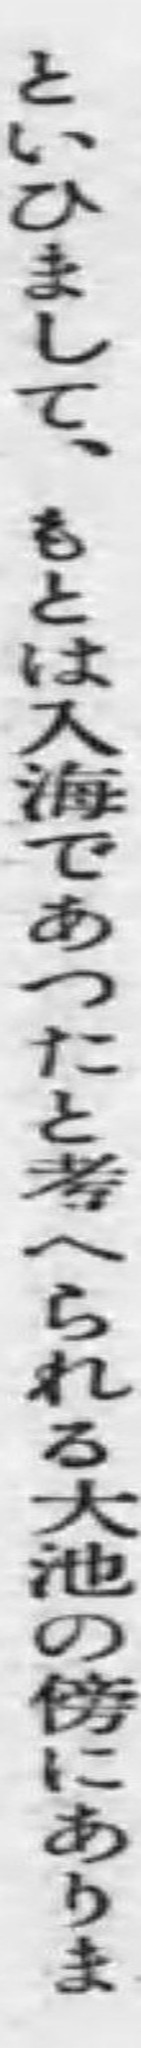といひまして、もとは入海であつたと考へられる大池の傍にありま
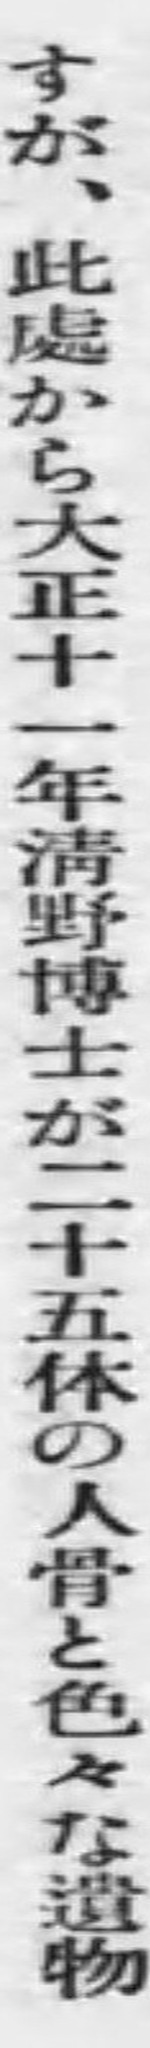すが、此処から大正十一年清野博士が二十五体の人骨と色々な遺物
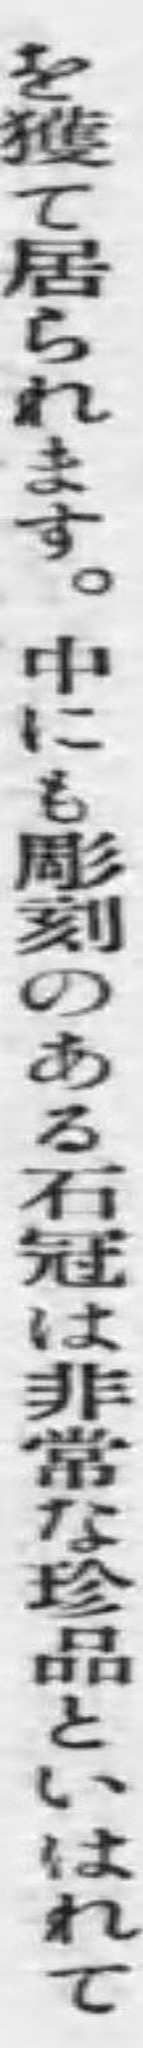を獲て居られます。中にも彫刻のある石冠は非常な珍品といはれて
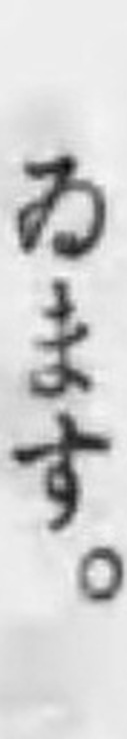ゐます。
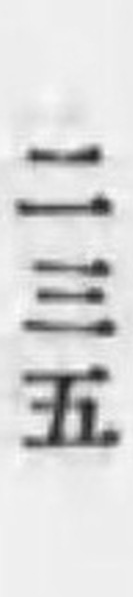二三五

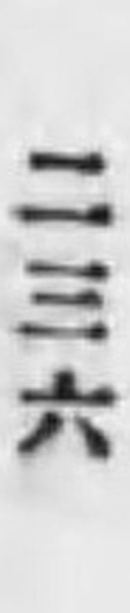二三六
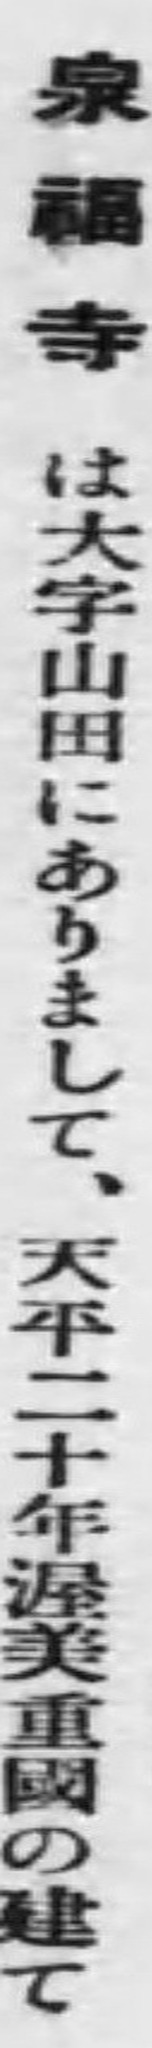泉福寺は大字山田にありまして、天平二十年渥美重国の建て
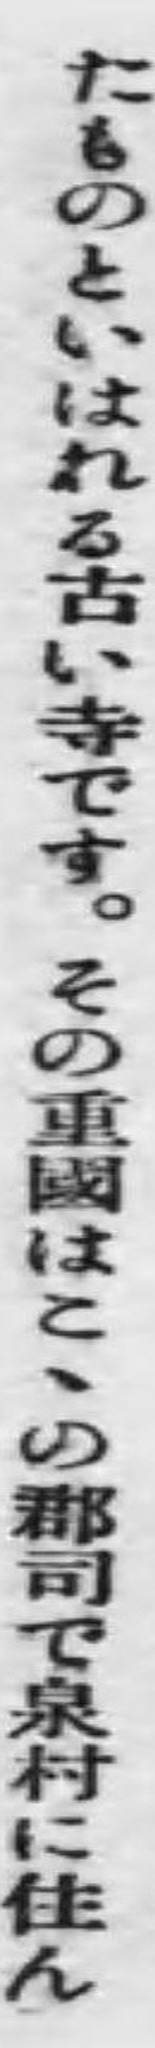たものといはれる古い寺です。その重国はこゝの郡司で泉村に住ん
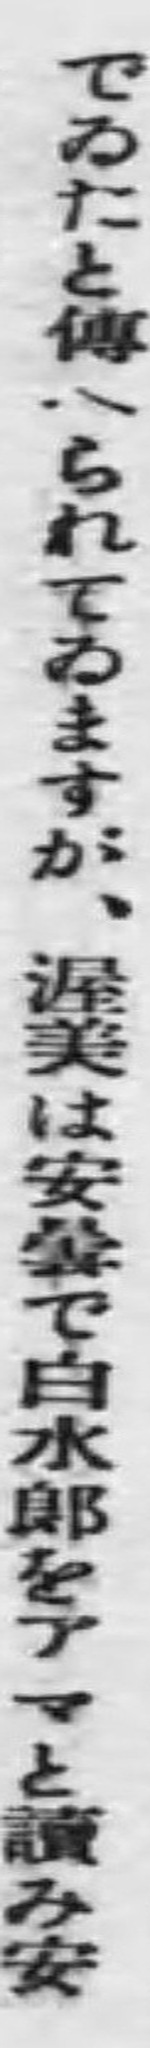でゐたと伝へられてゐますが、渥美は安曇で白水郎をアマと読み安
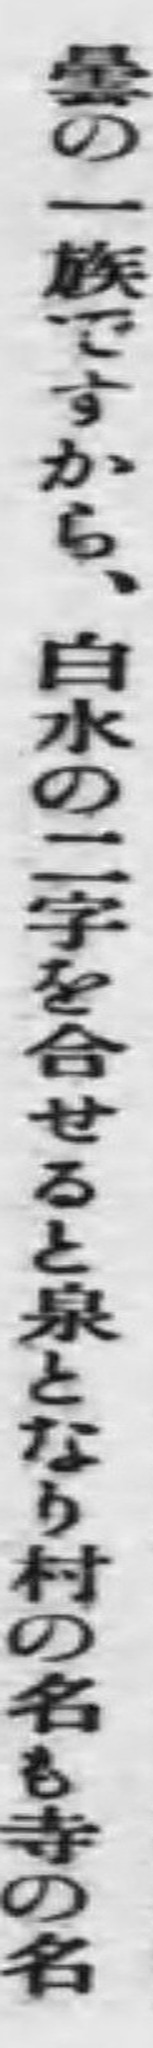曇の一族ですから、白水の二字を合せると泉となり村の名も寺の名
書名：東三河道中記 : 豊橋市及其附近案内
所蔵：国立国会図書館 National Diet Library, JAPAN
